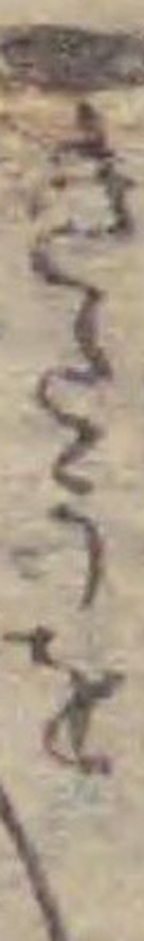きとうを
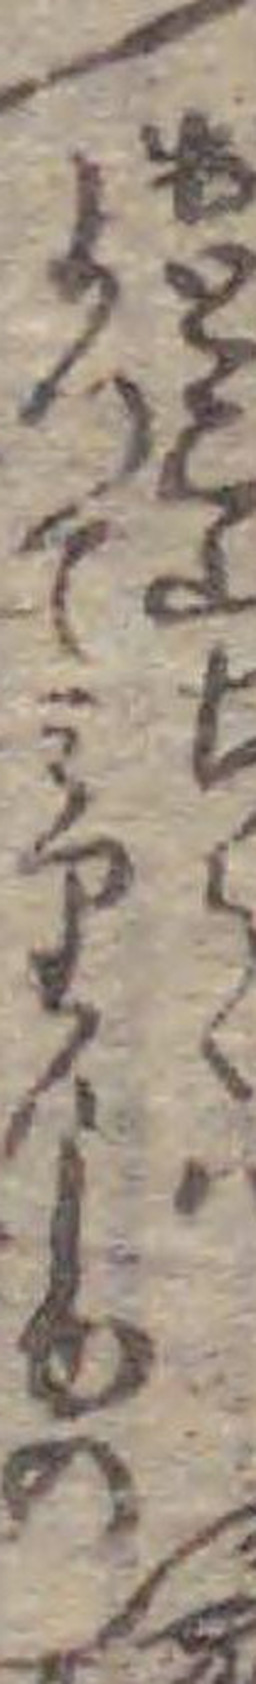よつてみりんしゆの
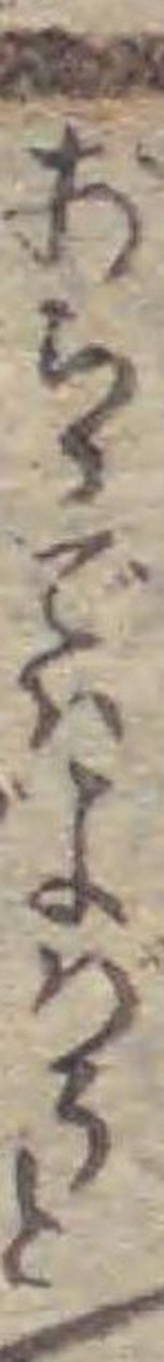あちらではよばうと
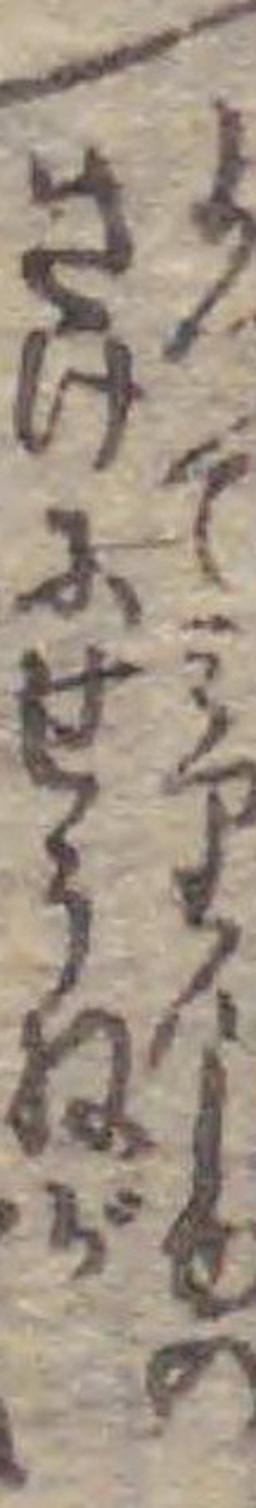さけにせうねが
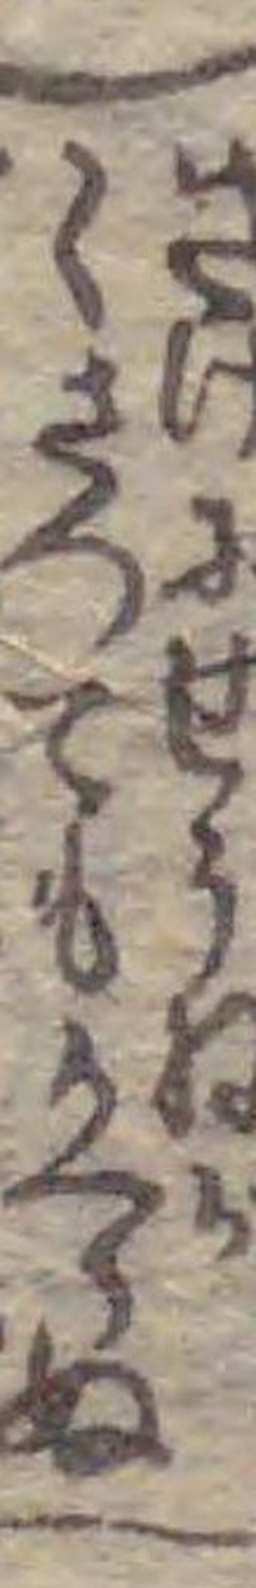くさつてもかへらぬ
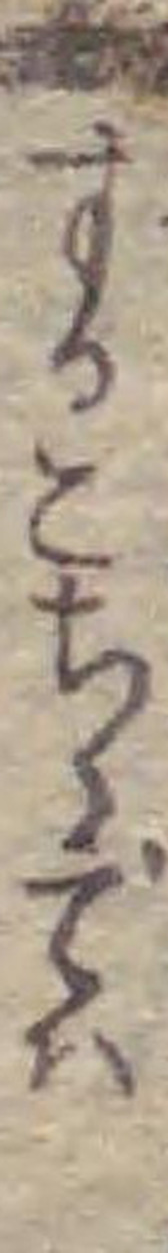するこちらでは
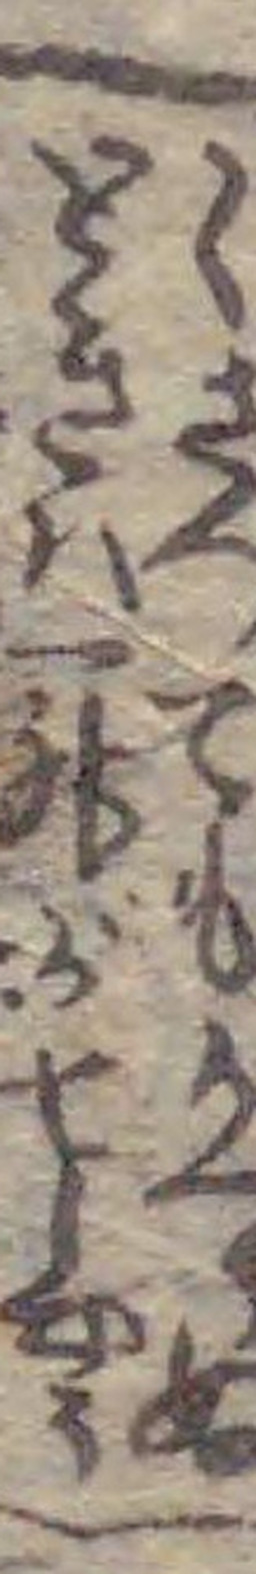ときは一升が七しゆう
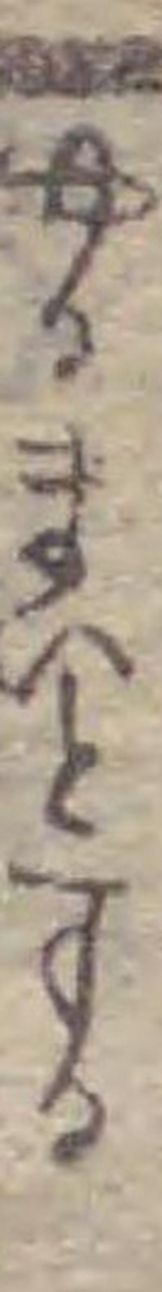やるまいとする
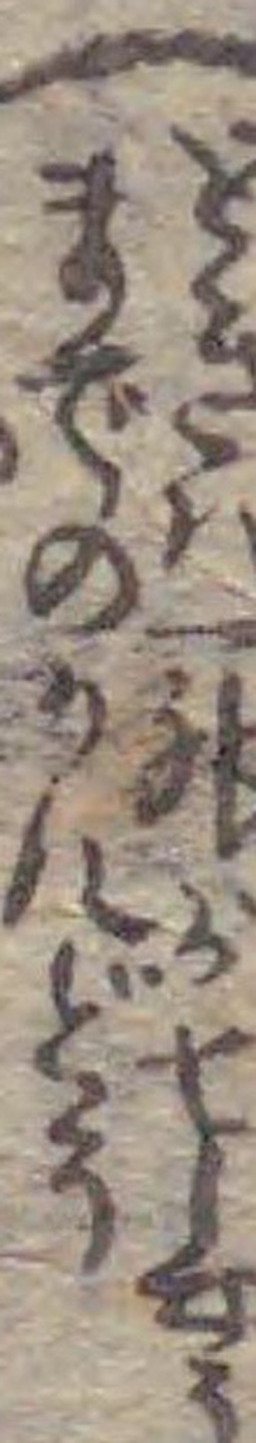までのかんどう
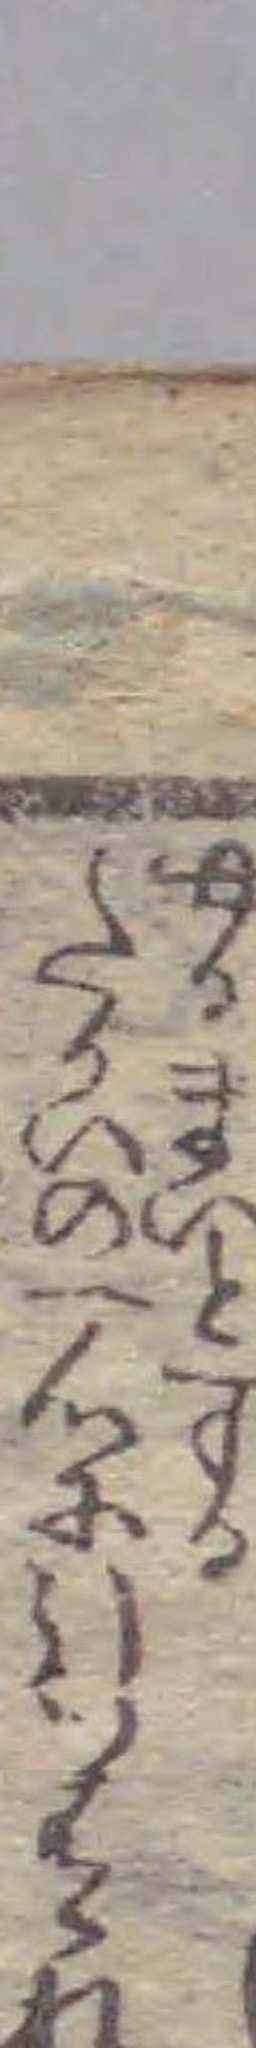たかいの一心に引つはられ
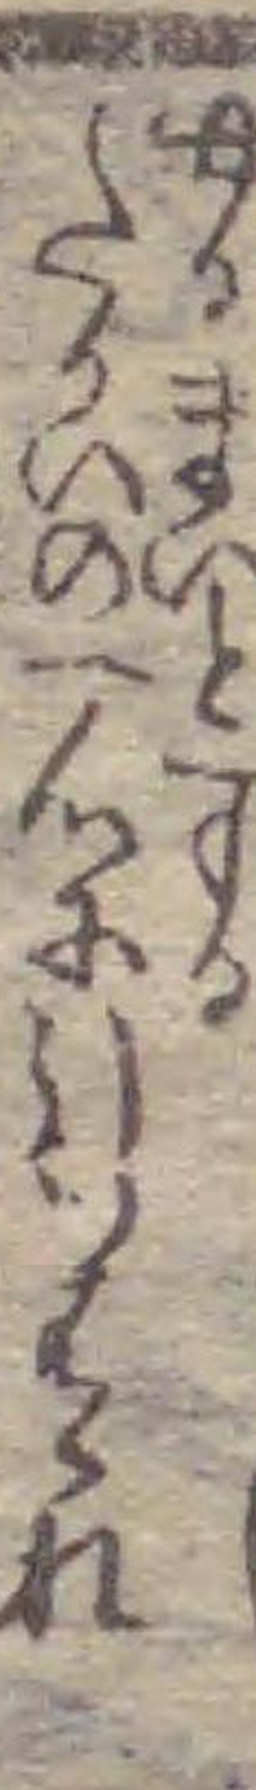たかいの一心に引つはられ
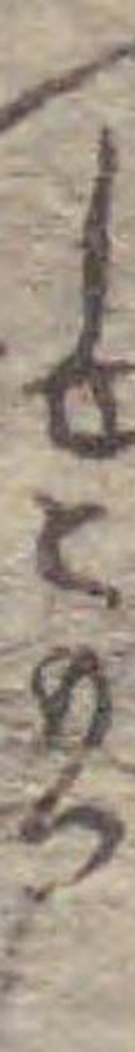しゆこもつ
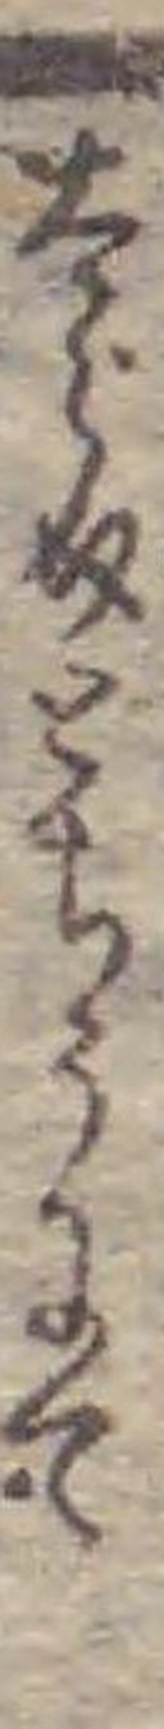太郎介とちうにて
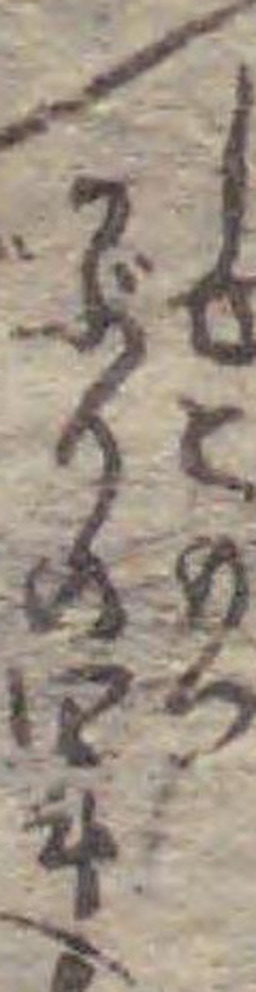かぶりの四斗
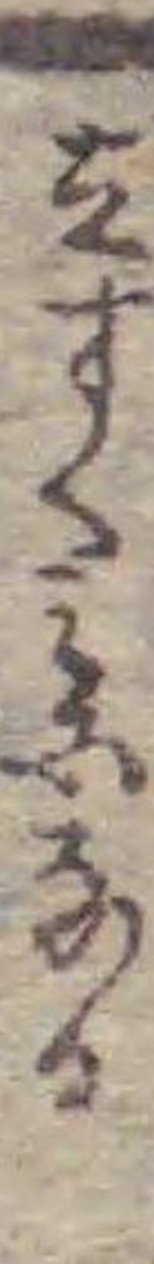立すくみになる
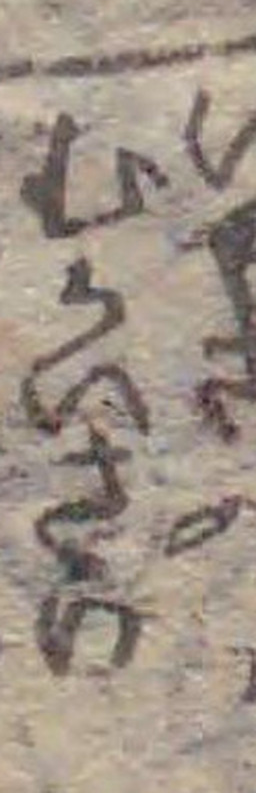むかいさけ
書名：四遍搨心学草帋 : 3巻
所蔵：国立国会図書館 National Diet Library, JAPAN
